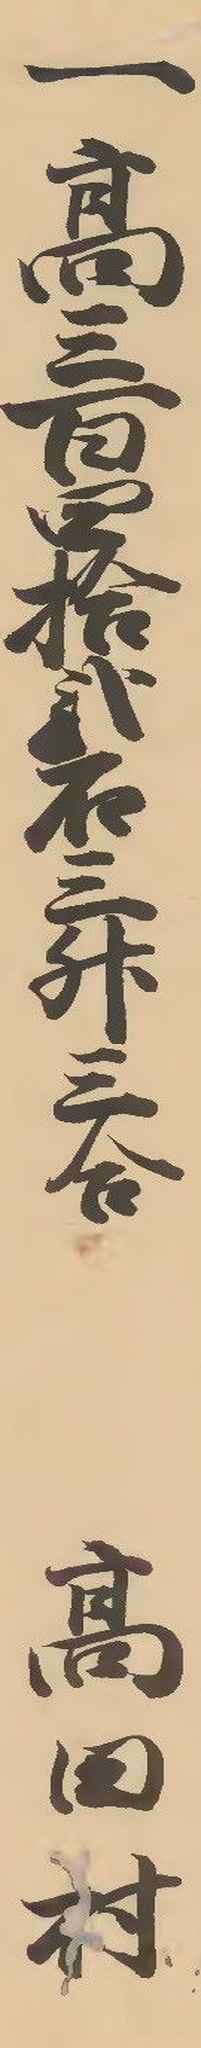一髙三百四拾弐石三升三合髙田村
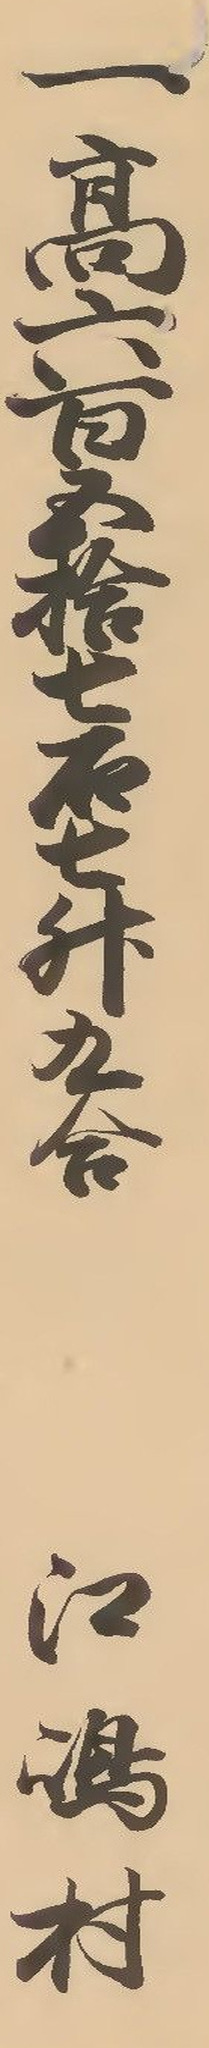一髙六百五拾七石七升九合江嶋村
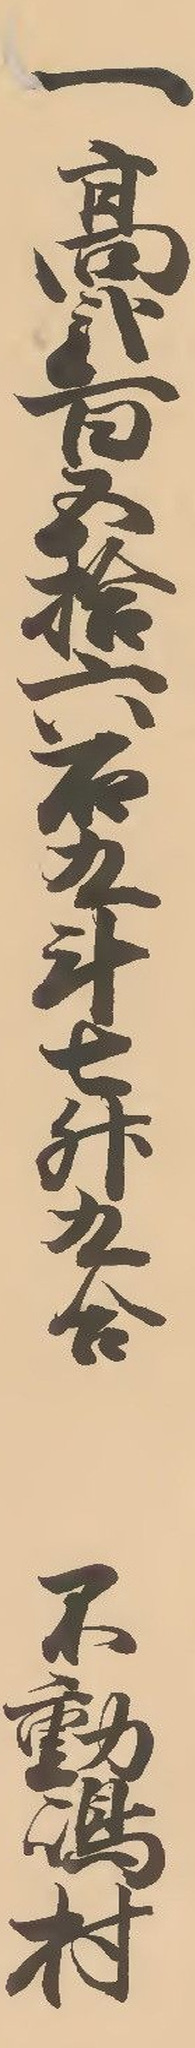一髙弐百五拾六石九斗七升九合不動嶋村
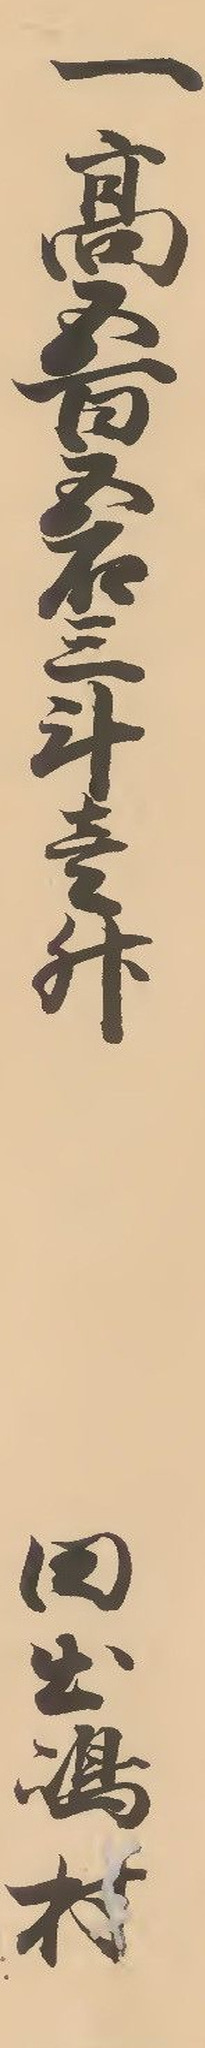一髙五百五石三斗壱升田出嶋村
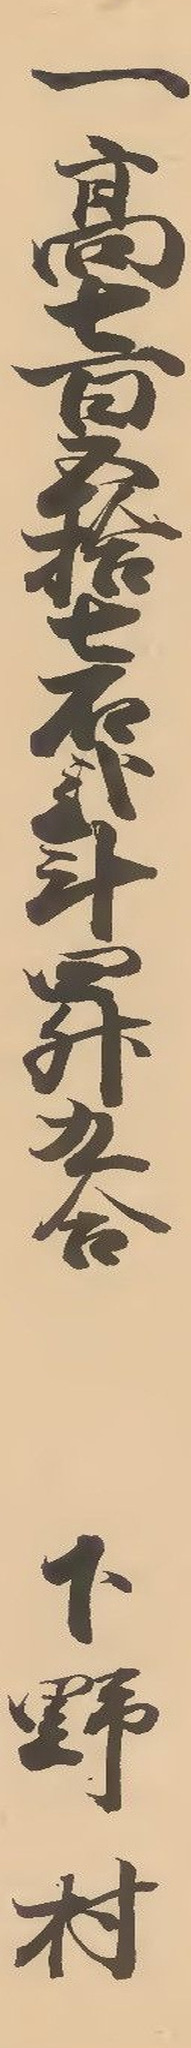一髙七百五拾七石弐斗四升九合下野村
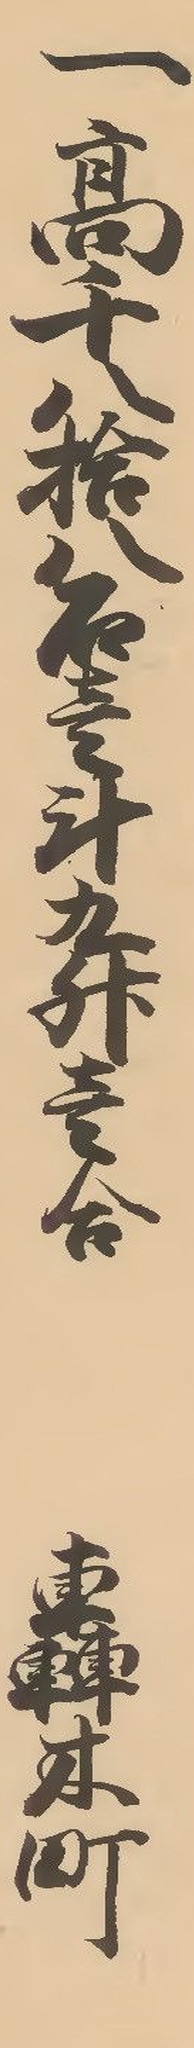一髙千八拾八石壱斗九合壱合轟木町

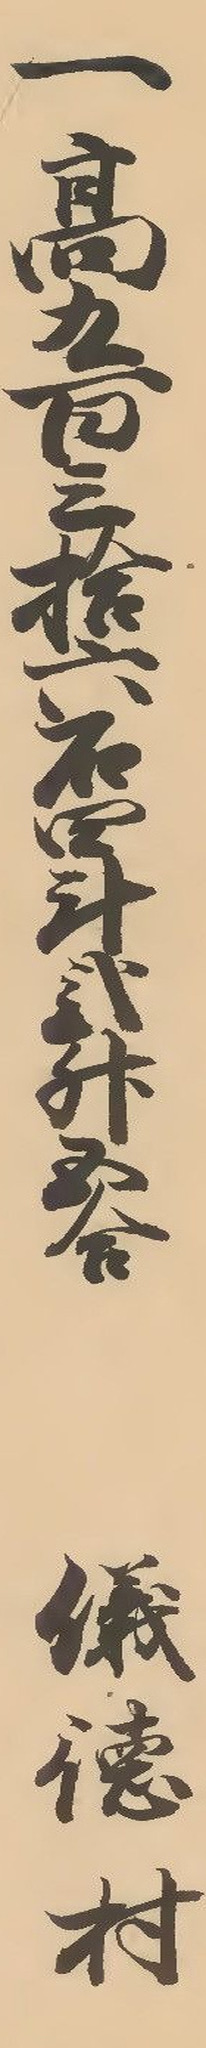一髙九百三拾六石四斗弐升五合儀徳村
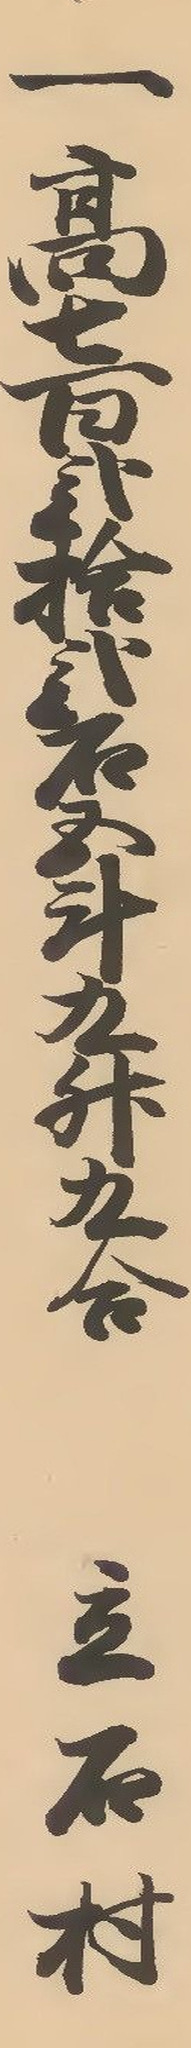一髙七百弐拾弐石五斗九升九合立石村
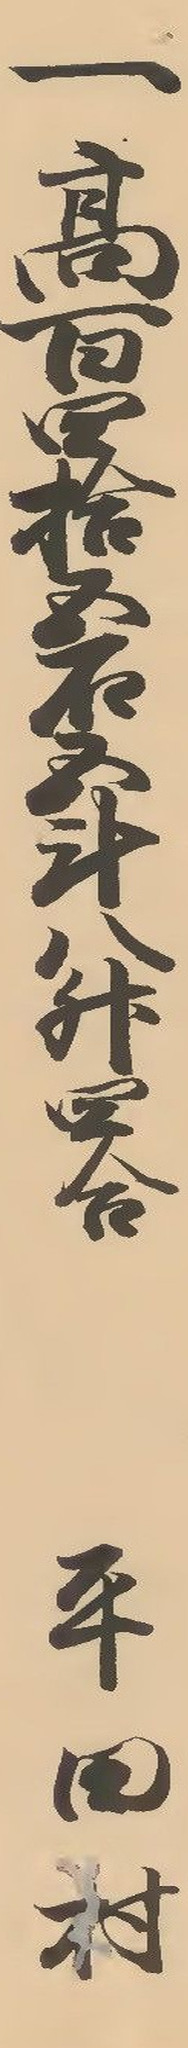一髙百四拾五石五斗八升四合平田村
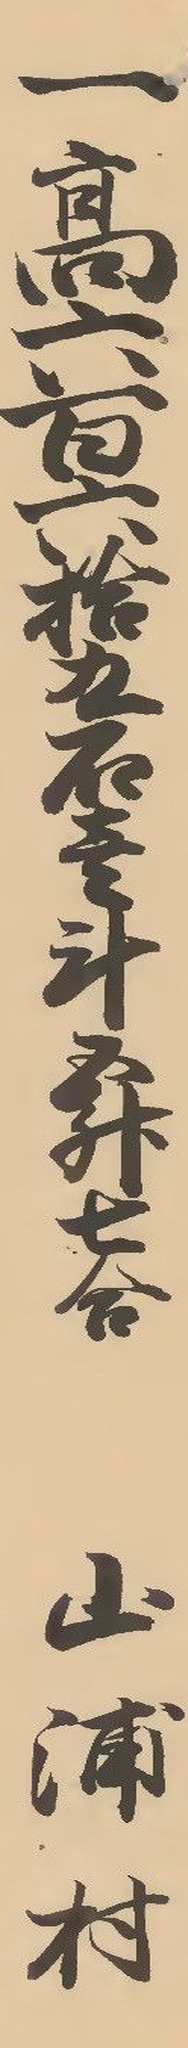一髙六百六拾九石壱斗五升七合山浦村
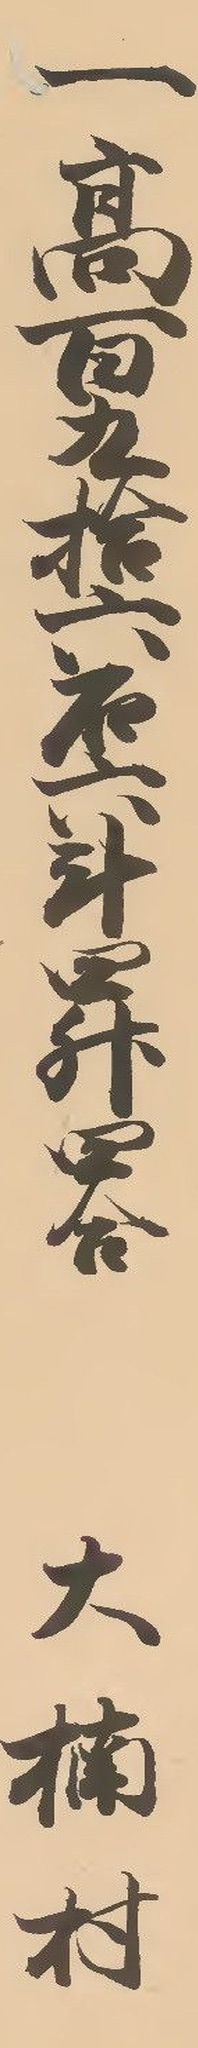一髙百九拾六石六斗四升四合大楠村
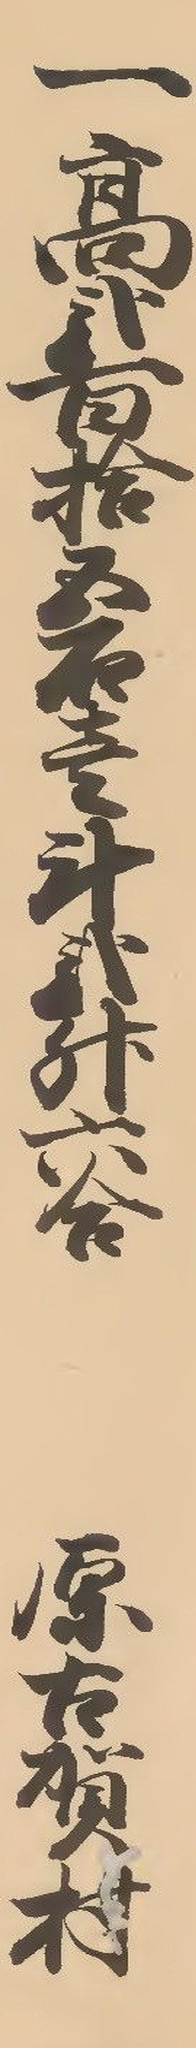一髙弐百拾五石壱斗弐升六合原古賀村
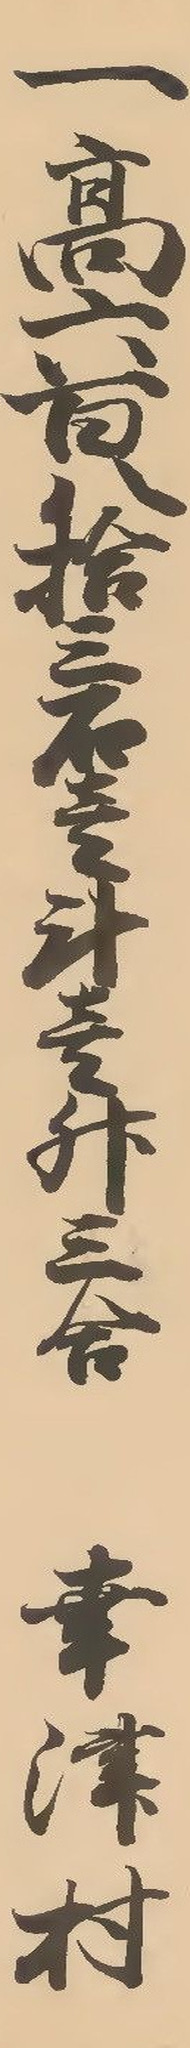一髙六百八拾三石壱斗壱升三合幸津村
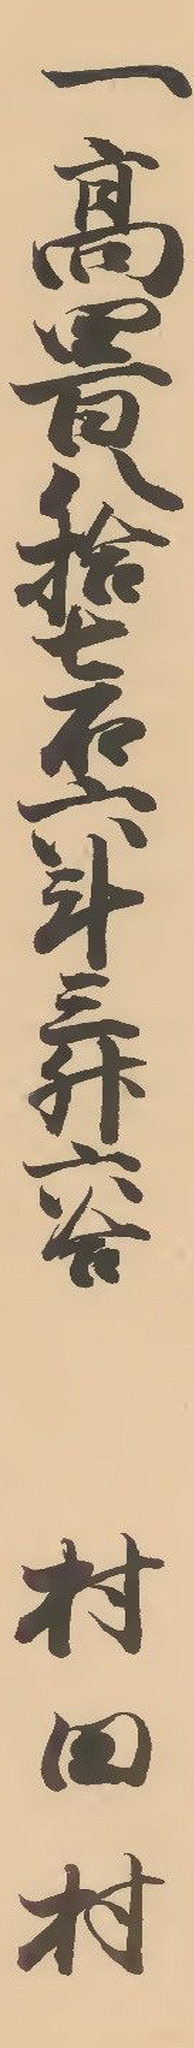一髙四百八拾七石六斗三升六合村田村

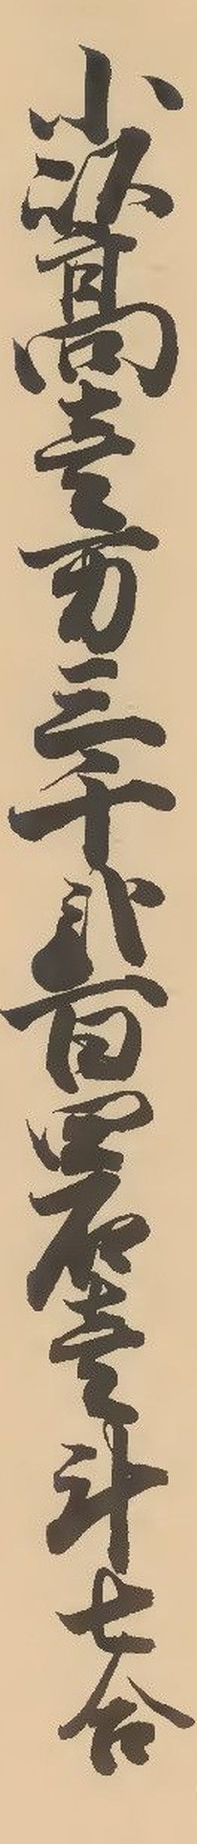小以髙壱万三千弐百四石壱斗七合
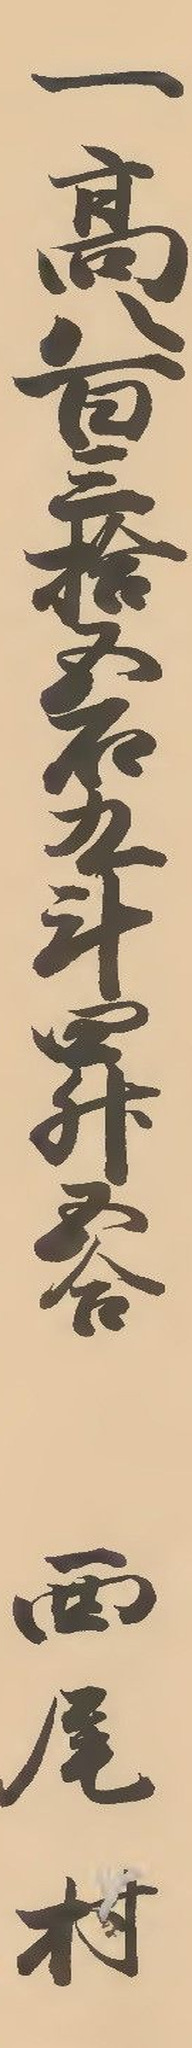一髙八百三拾五石九斗四升五合西尾村
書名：肥前国郷帳
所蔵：国立公文書館 National Archives of Japan
